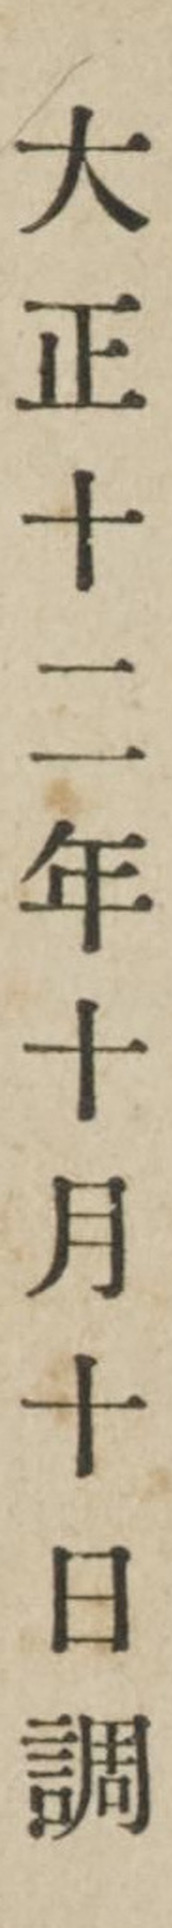大正十二年十月十日調
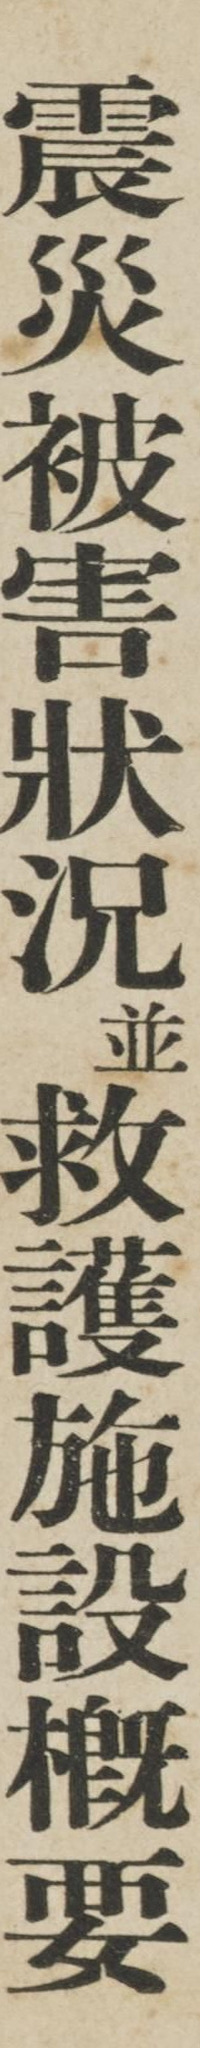震災被害状況並救護施設概要
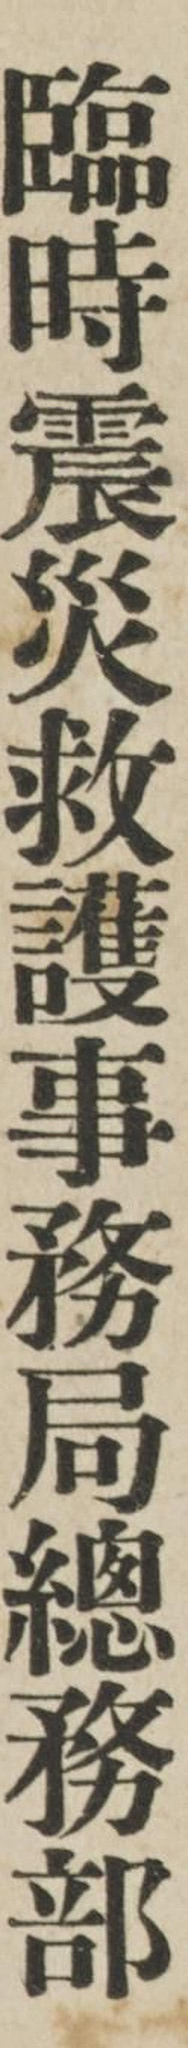臨時震災救護事務局総務部

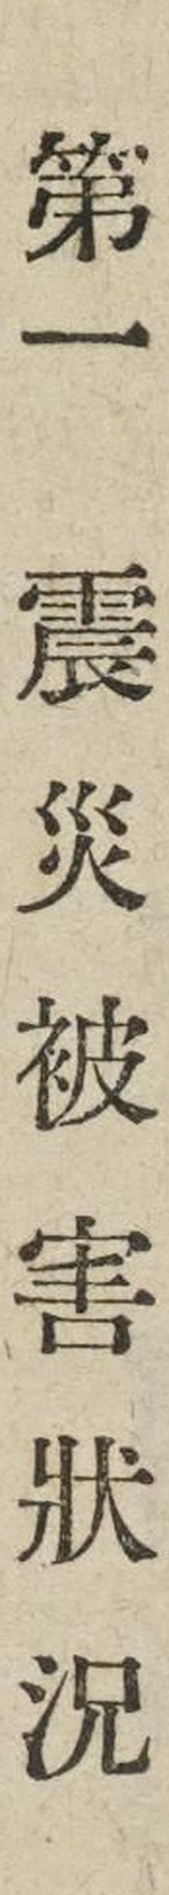第一震災被害状況
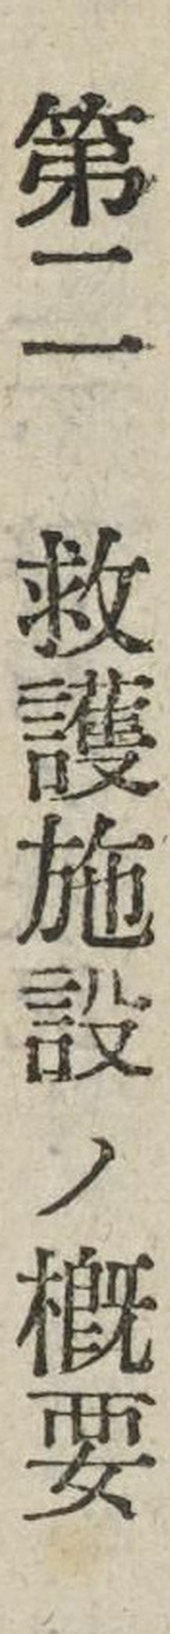第ニ救護施設ノ概要

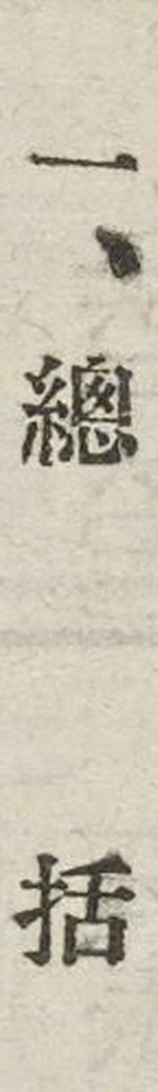一、総括
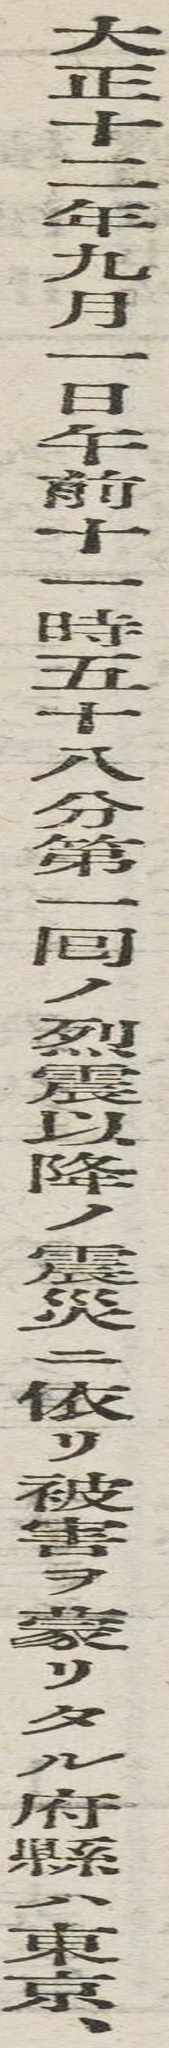大正十二年九月一日午前十一時五十八分第一回ノ烈震以降ノ震災ニ依リ被害ヲ蒙リタル府県ハ東京、
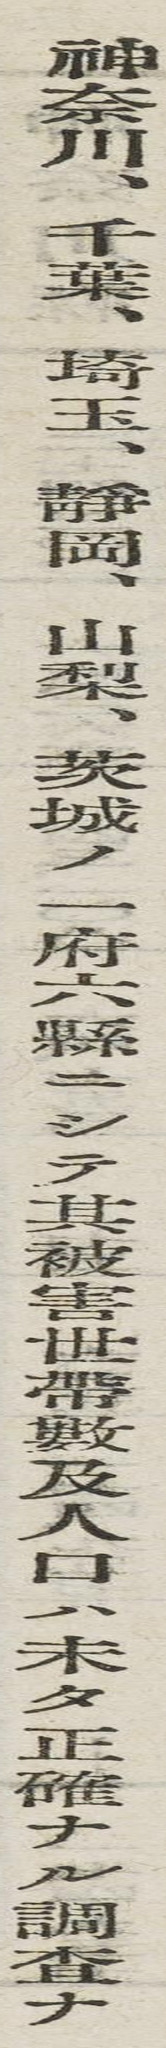神奈川、千葉、埼玉、静岡、山梨、茨城ノ一府六県ニシテ其被害世帯数及人口ハ未タ正確ナル調査ナ
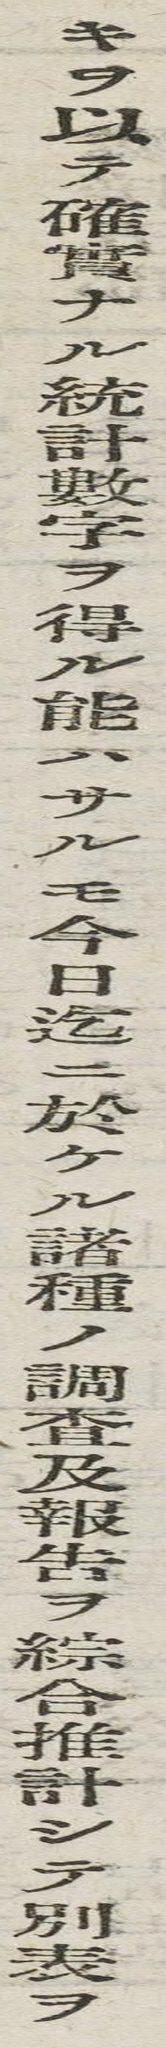キヲ以テ確実ナル統計数字ヲ得ル能ハサルモ今日迄ニ於ケル諸種ノ調査及報告ヲ総合推計シテ別表ヲ
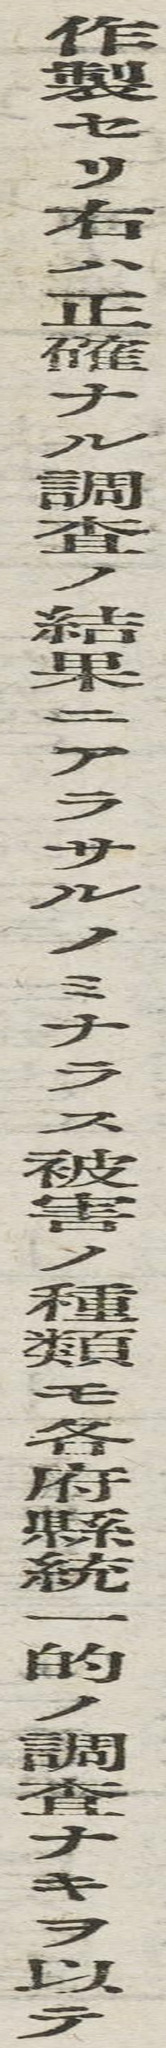作製セリ右ハ正確ナル調査ノ結果ニアラサルノミナラス被害ノ種類モ各府県統一的ノ調査ナキヲ以テ
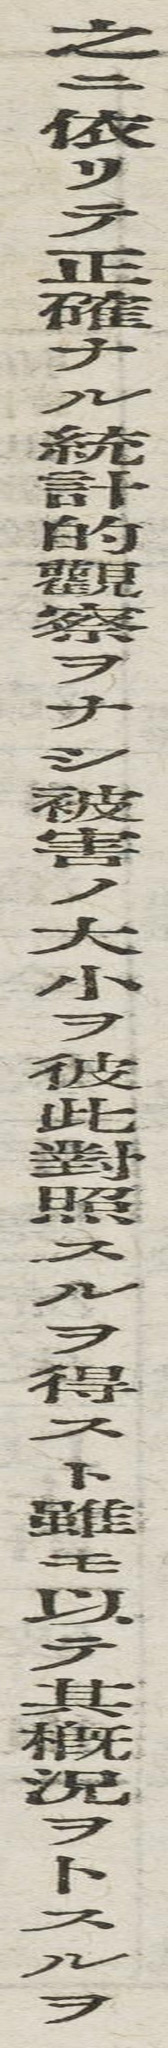之ニ依リテ正確ナル統計的観察ヲナシ被害ノ大小ヲ彼比対照スルヲ得スト雖モ以テ其概況ヲトスルヲ
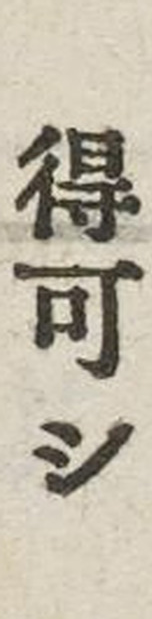得可シ
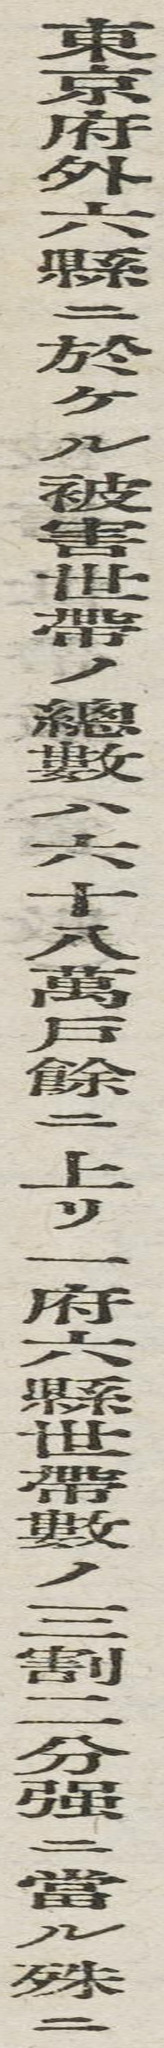東京府外六県ニ於ケル被害世帯ノ総数ハ六十八万戸余ニモ上リ一府六県世帯数ノ三割二分強ニ当ル殊ニ
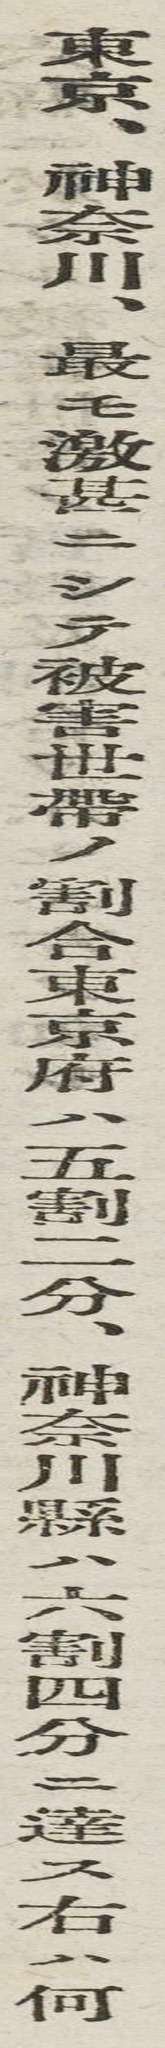東京、神奈川、最モ激甚ニシテ被害世帯ノ割合東京府ハ五割二分、神奈川県ハ六割四分ニ達ス右ハ何
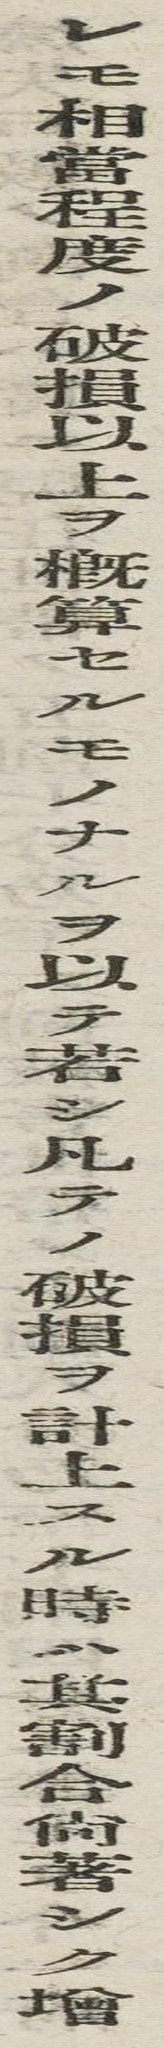レモ相当程度ノ破損以上ヲ概算セルモノナルヲ以テ若シ凡テノ破損ヲ計上スル時ハ其割合尚著シク増
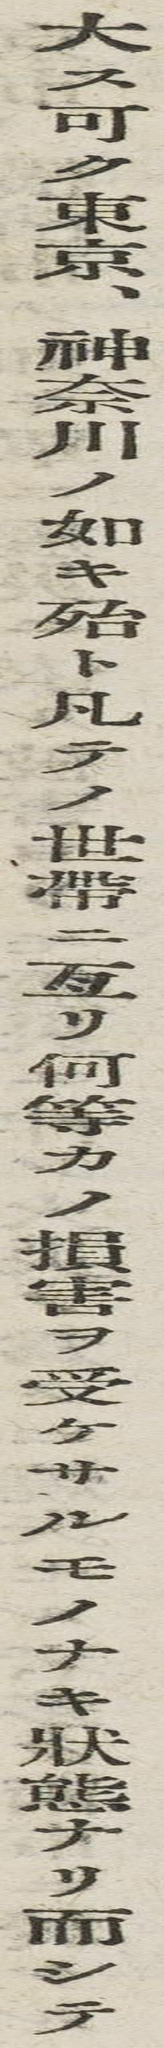大ス可ク東京、神奈川ノ如キ殆ト凡テノ世帯ニ互リ何等カノ損害ヲ受ケサルモノナキ状態ナリ而シモ
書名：震災被害状況並救護施設概要
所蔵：東京大学地震研究所図書室 Earthquake Research Institute Library, The University of Tokyo, JAPAN
